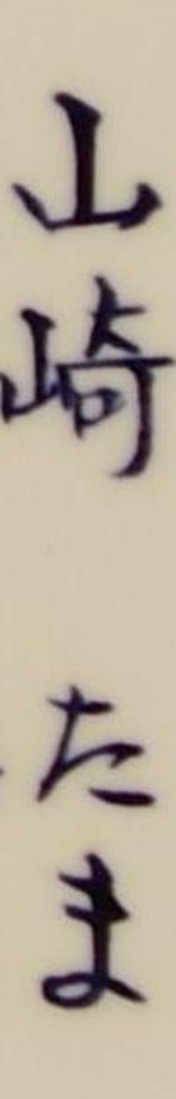山崎たま
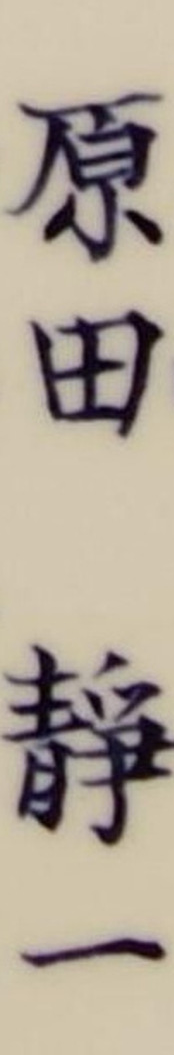原田静一
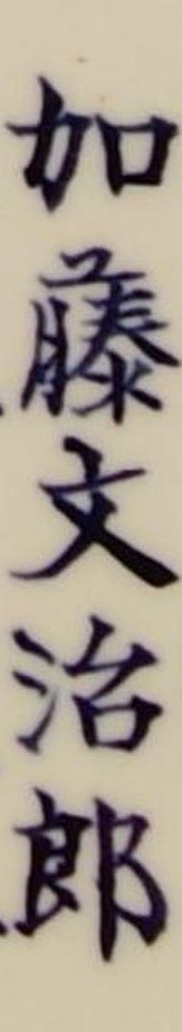加藤文治郎
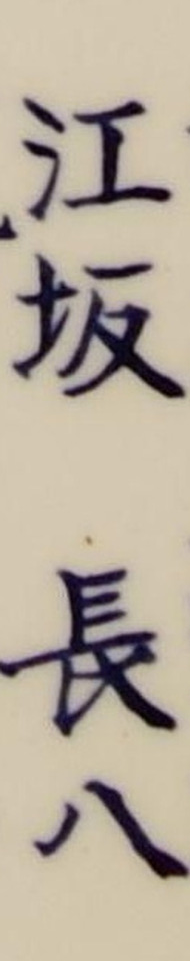江坂長八
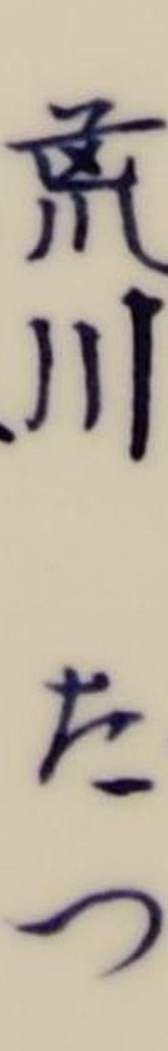荒川たつ
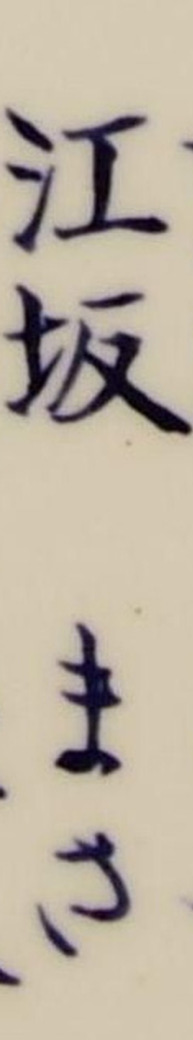江坂まさ
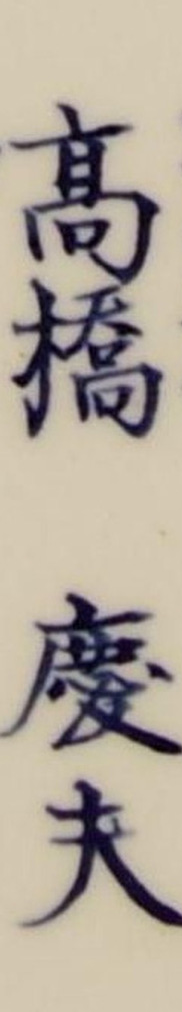高橋慶夫
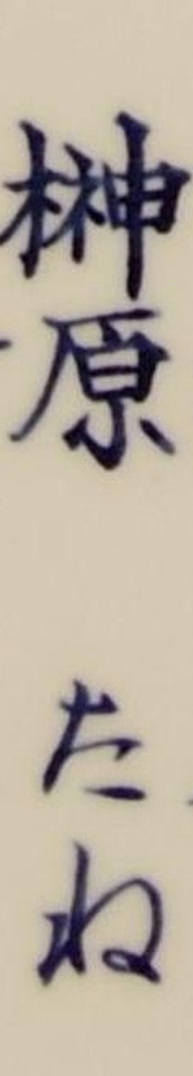榊原たね
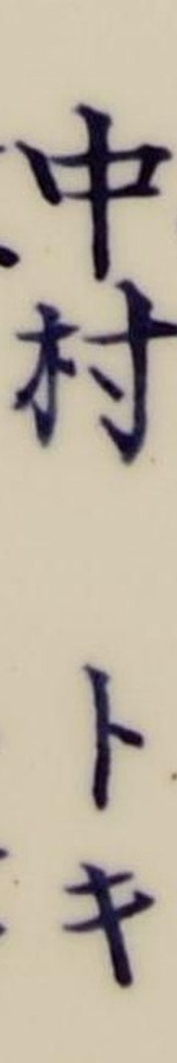中村トキ
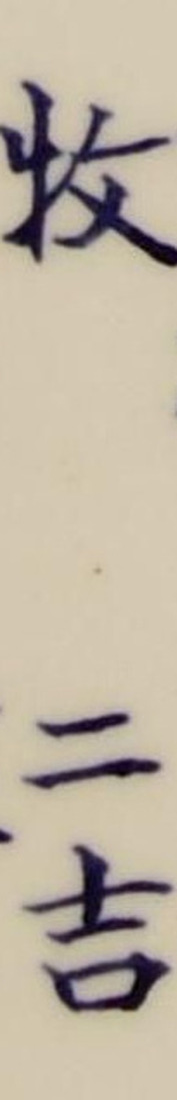牧二吉
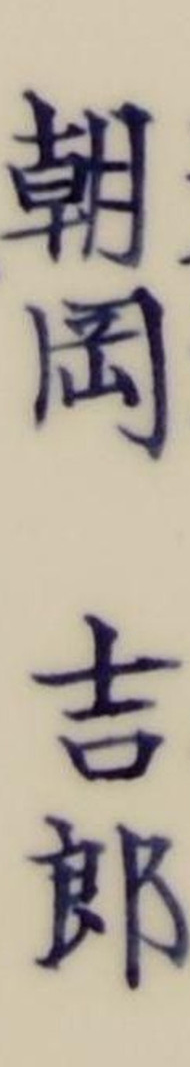朝岡吉郎
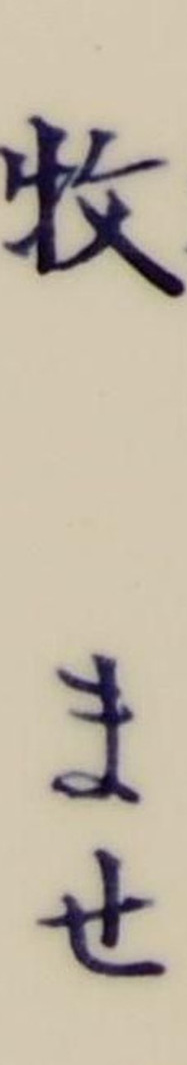牧ませ
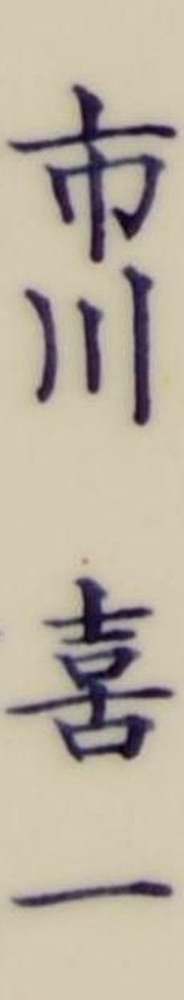市川喜一
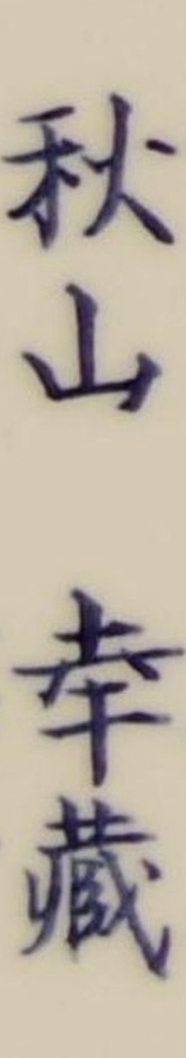秋山幸蔵
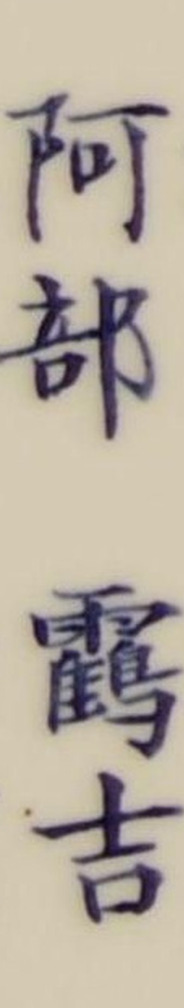阿部鶴吉
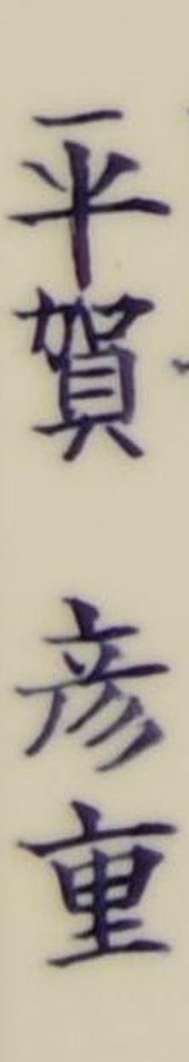平賀彦重
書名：E~L
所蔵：高野山金剛峯寺
